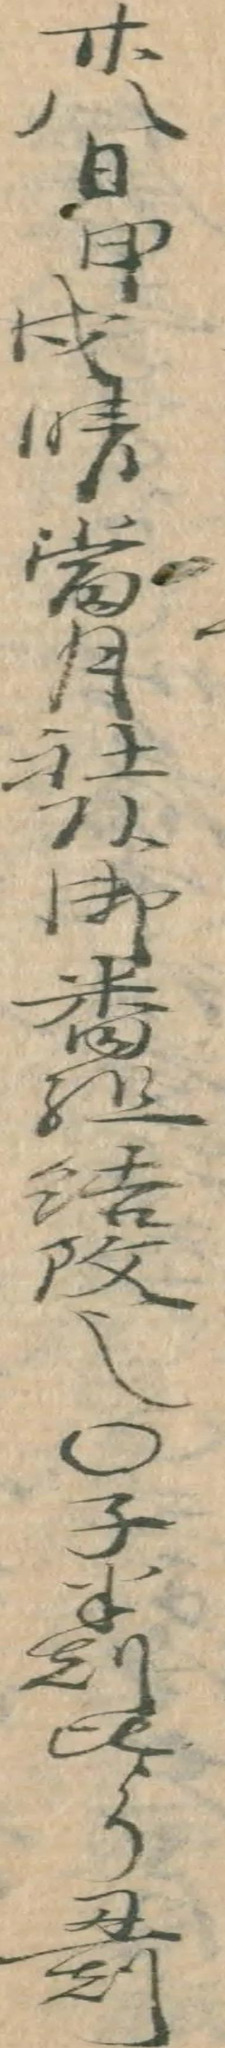廿八日甲戌晴當月社頭御番組詰改也〇子半刻頃より丑刻
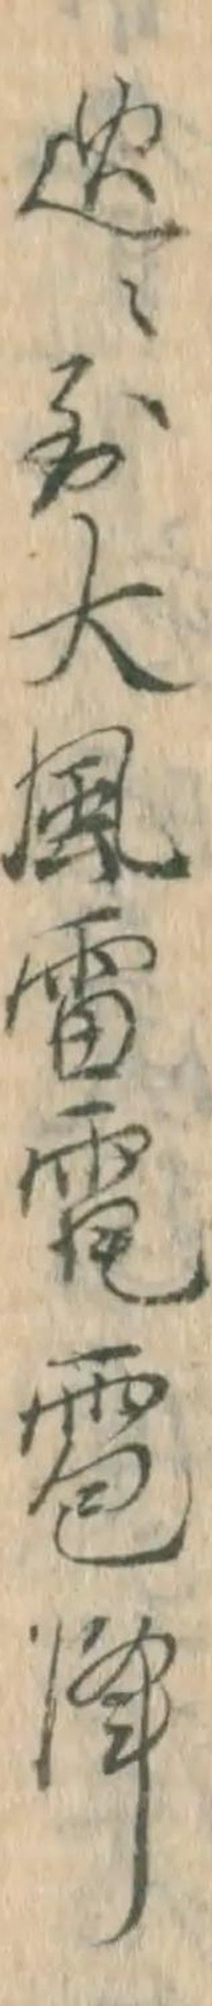過に至大風雷電雹降

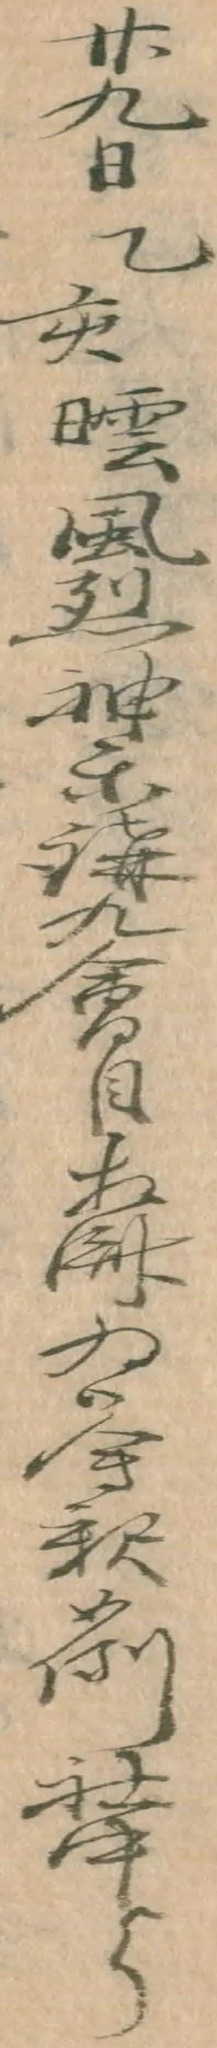廿九日乙亥曇風烈神楽講九會目相済為御會釈如例社中より
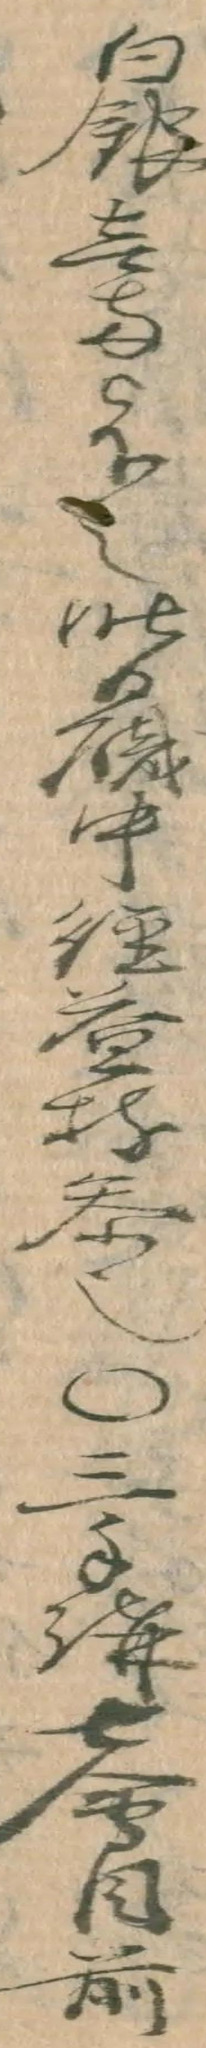白銀壱両被下也昨日職中経益持参也○三手講七會目前
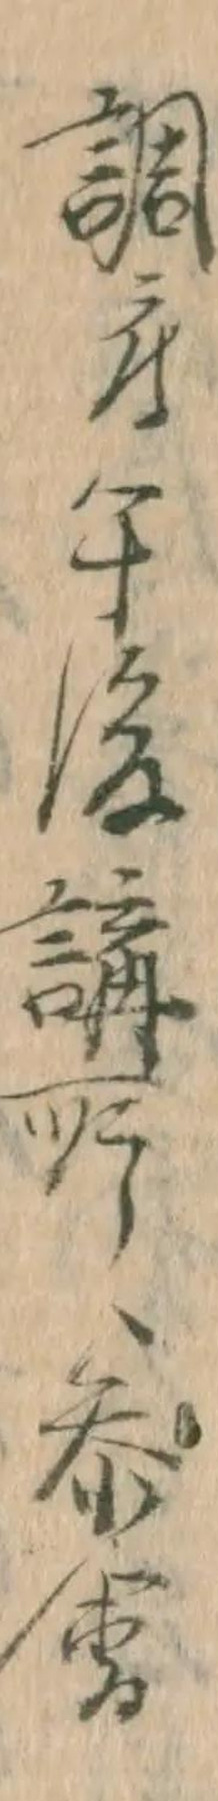調付午後講所へ参會
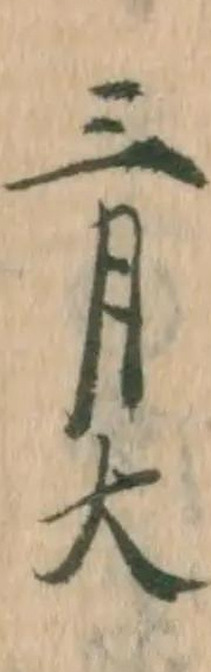三月大
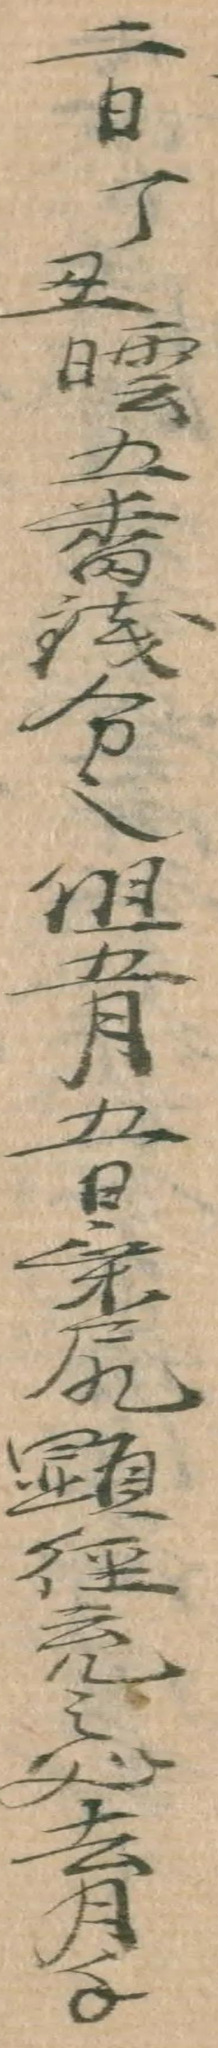二日丁丑曇五番銭分也但五月五日乗尻顕径充之処去月手
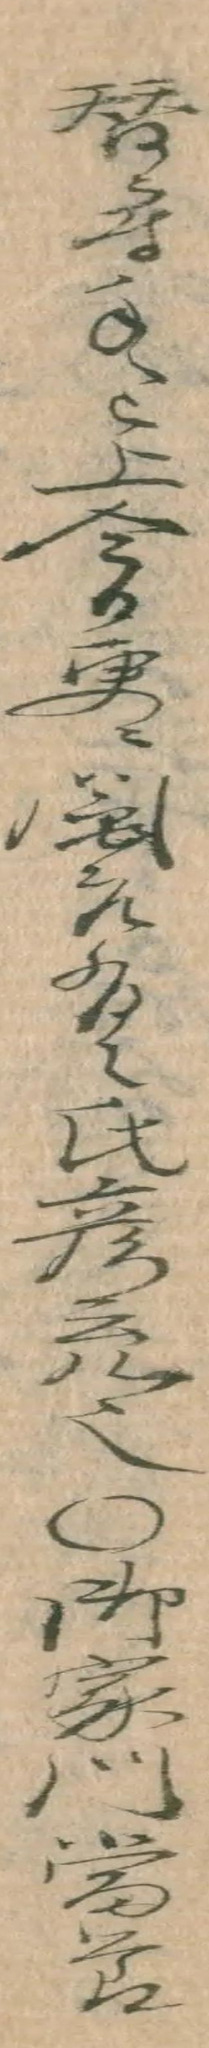替ニ付手へ被上今日更ニ鬮差有之氏彦充也○御家門當節
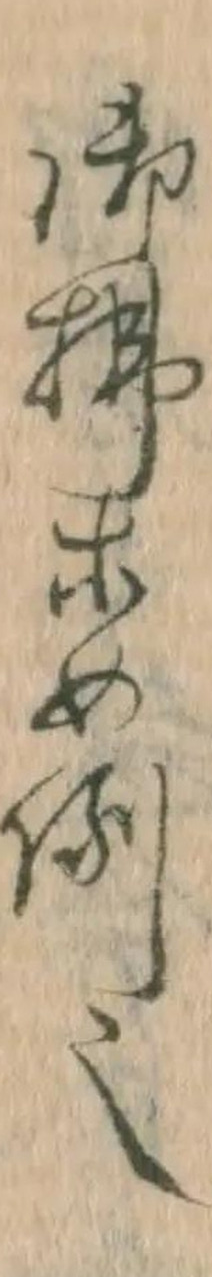御払等如例也
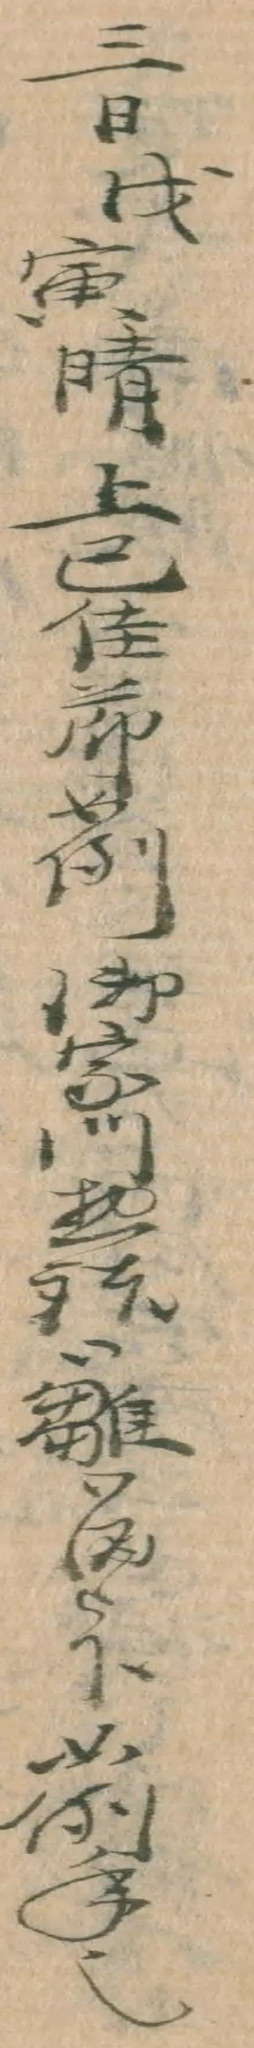三日戊寅晴上巳佳節如例御家門惣詰御雛御酒被下如例年也
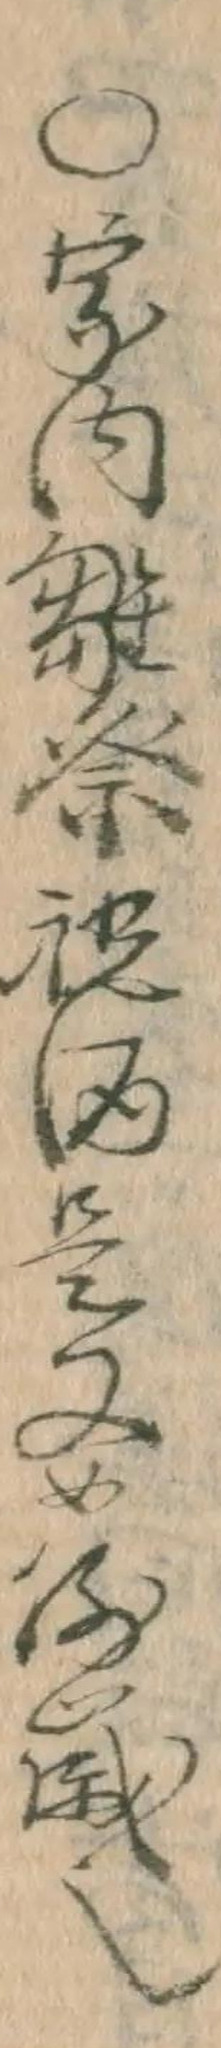○家内雛祭祝酒是又如例歳之
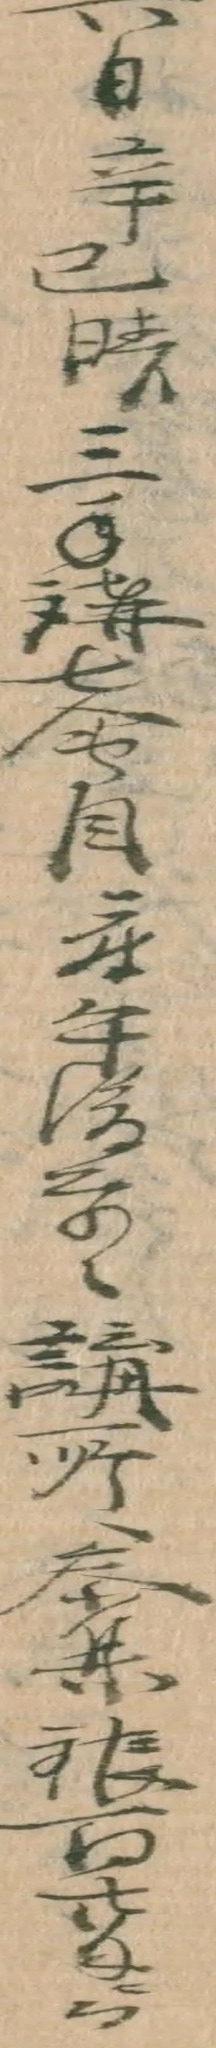六日辛巳晴三手講七會目午後前之講所へ参集銀百廿匁ニ而
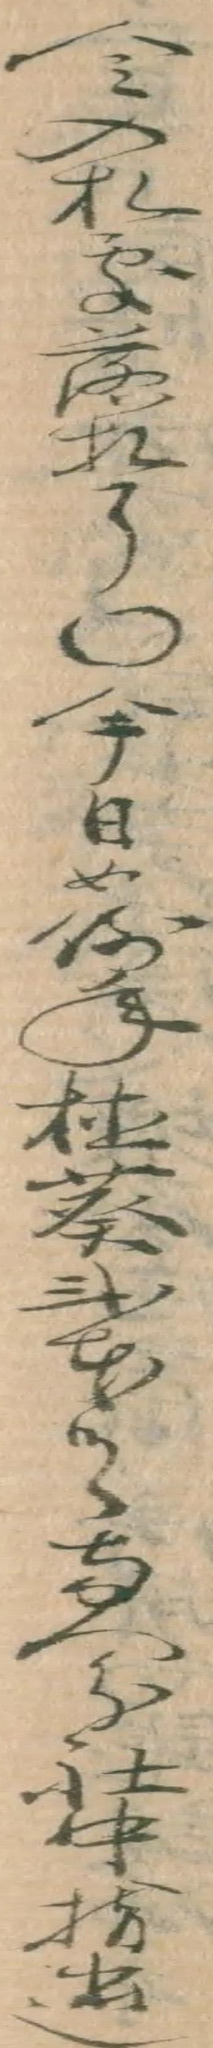令入札處落札了○今日如例年植葵弐本ツゝ両人分社中ヘ指出也
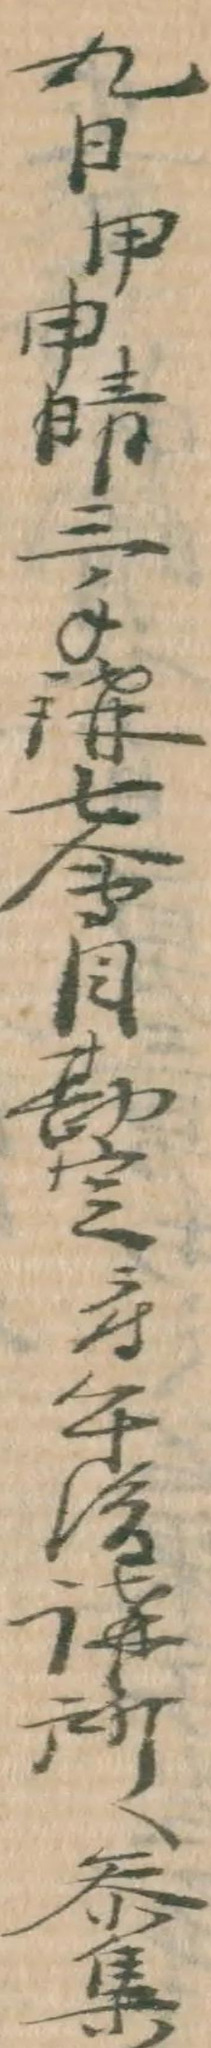九日甲申晴三手講七會目勘定ニ付午後講所へ参集
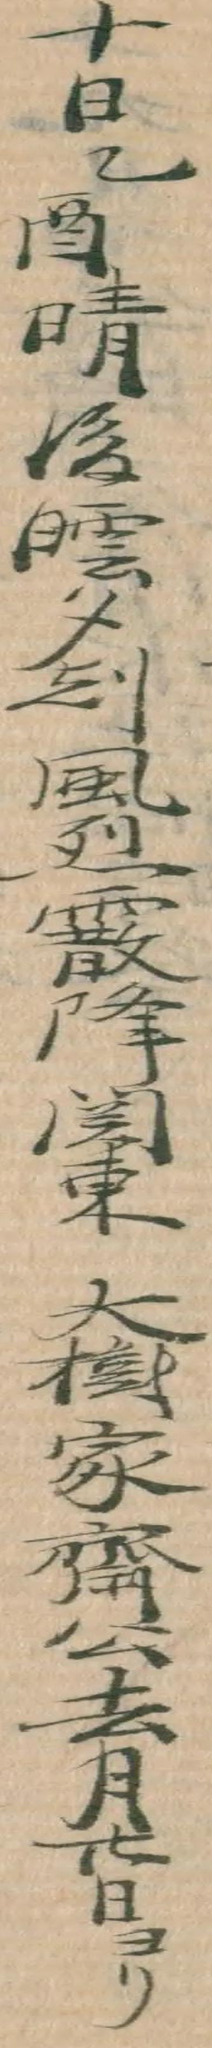十日乙酉晴後曇夕刻風烈霰降関東大樹家齋公去月廿日ヨリ
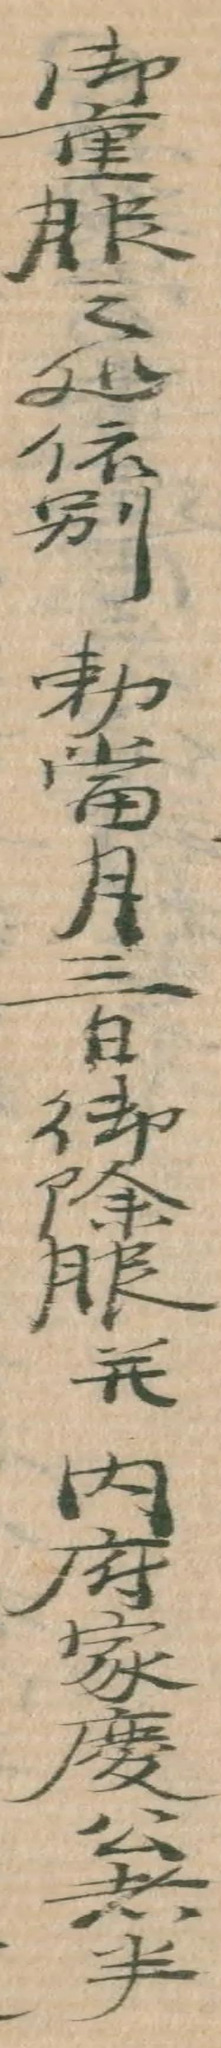御重服之処依別勅當月三日御除服并内府家慶公者半
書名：賀茂社記録. 第65冊
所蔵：国立国会図書館 National Diet Library, JAPAN
